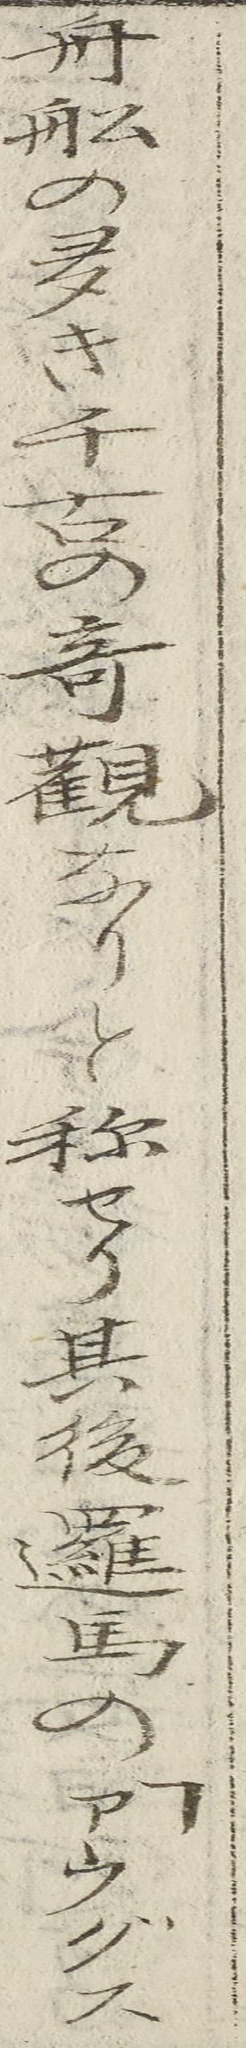舟船の多き千古の奇観なりと称せり其後邏馬の「アウグス
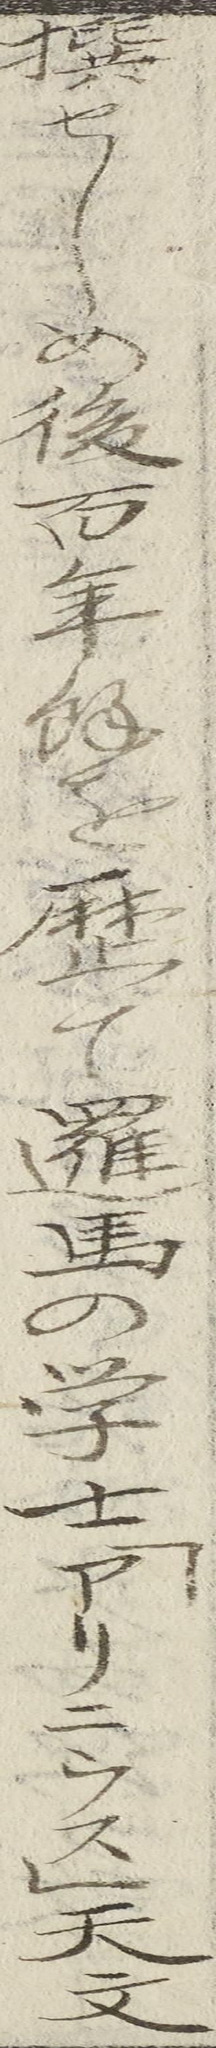撰せしめ後百年余を歴て邏馬の学士「アリ二ウス」天文
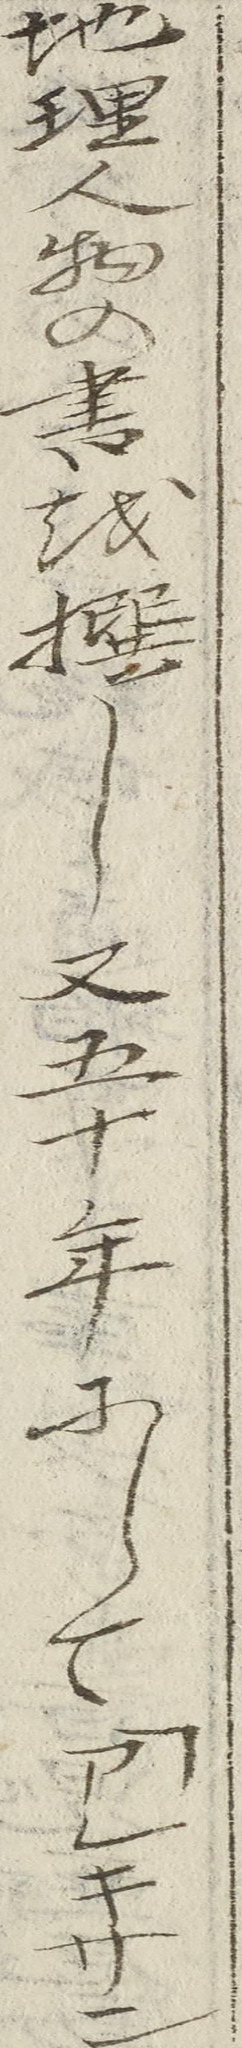地理人物の書を撰し又五十年にして「アレキサン
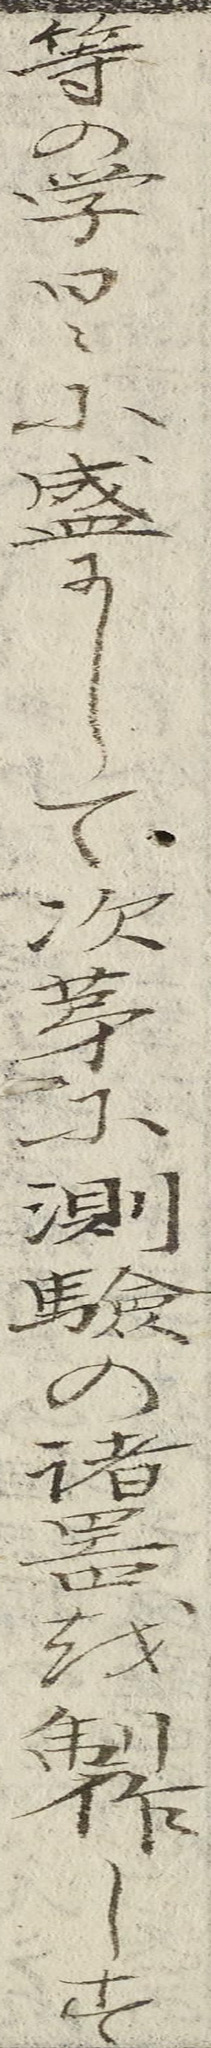等の学日々に盛にして次第に測験の諸器を制作しす
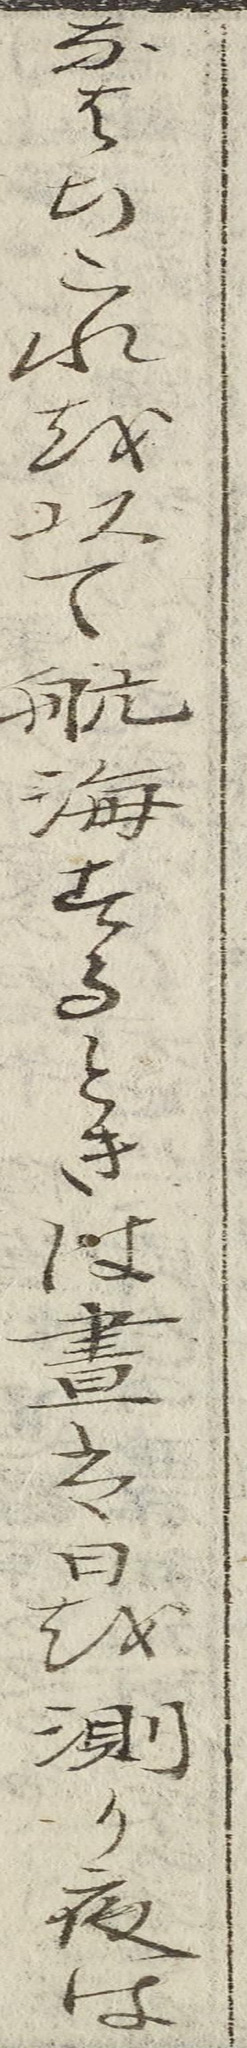なはちこれを以て航海するときは晝は日を測り夜は
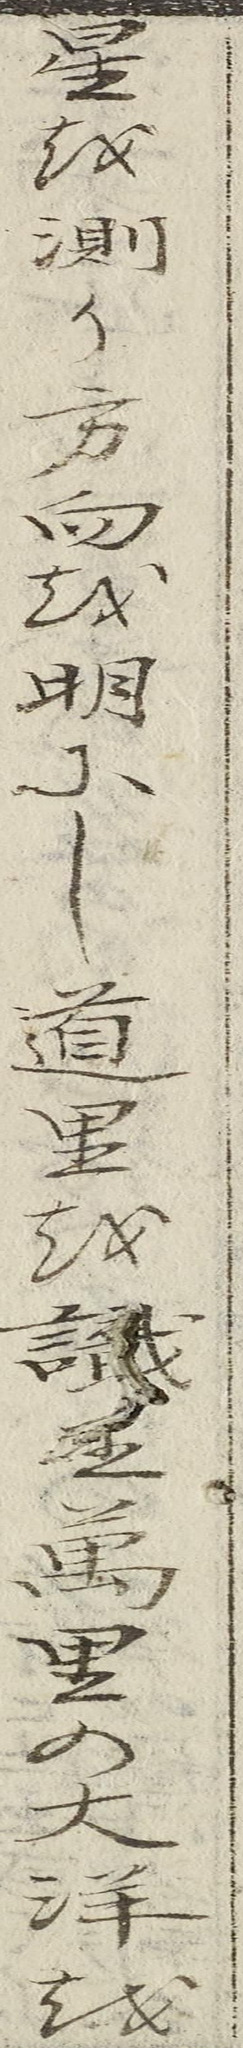星を測り方向を明にし道里を識り万里の大洋を
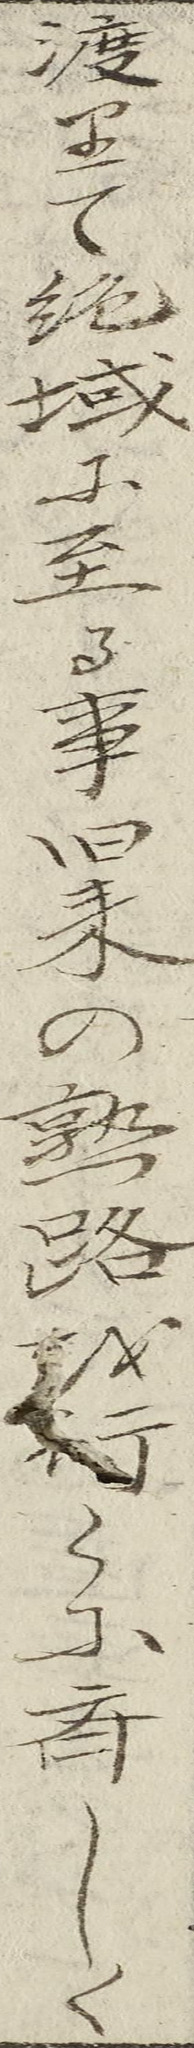渡りて絶域に至る事旧来の熟路を行くに斉しく
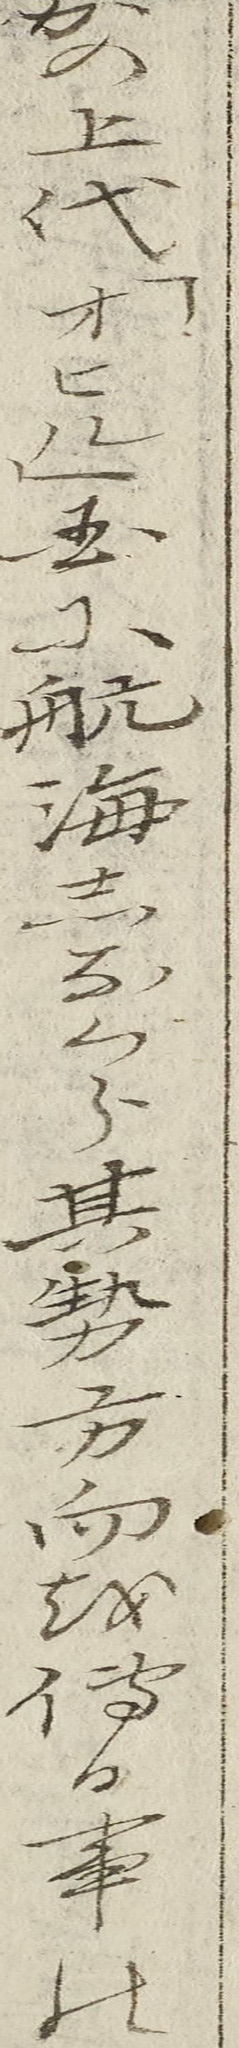かの上代「オヒル」国に航海しなから其勢方向を伝る事の
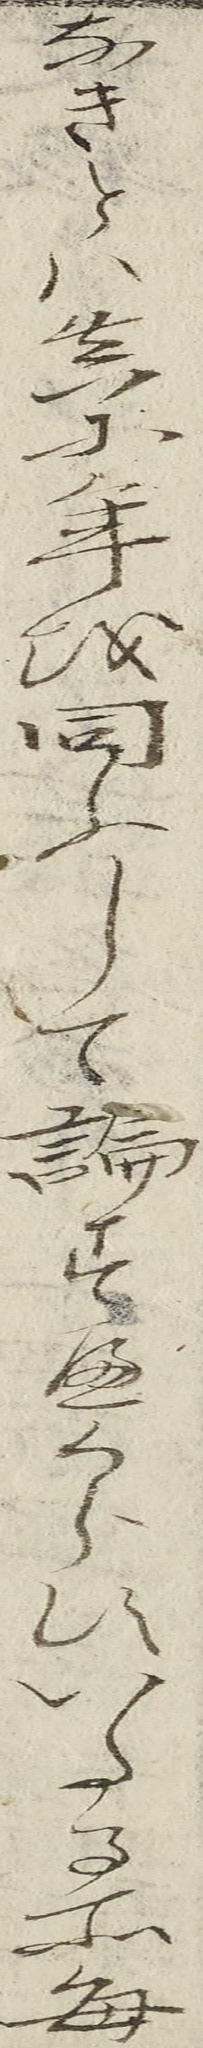なきとハ真に年を同ふして論すへからすいたる所毎
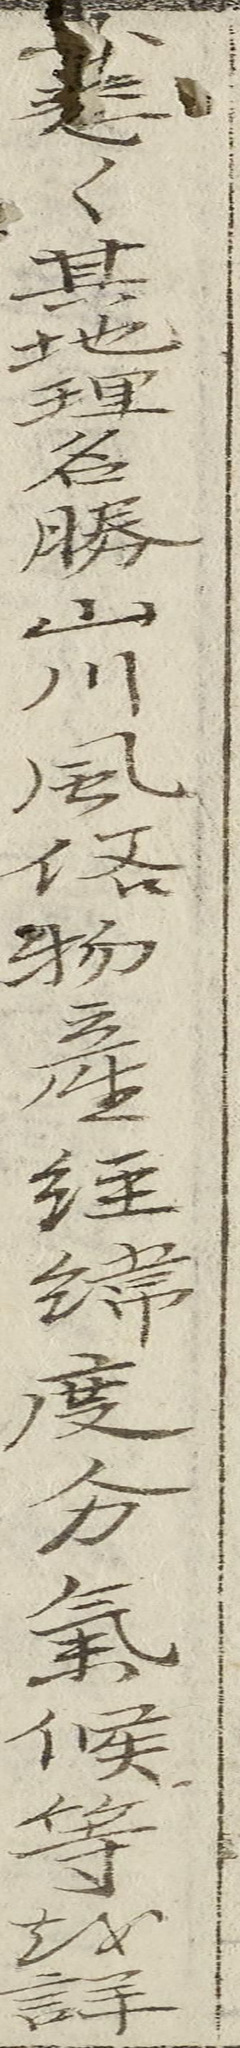と悉く其地理名勝山川風俗物産径緯度分気候等を詳
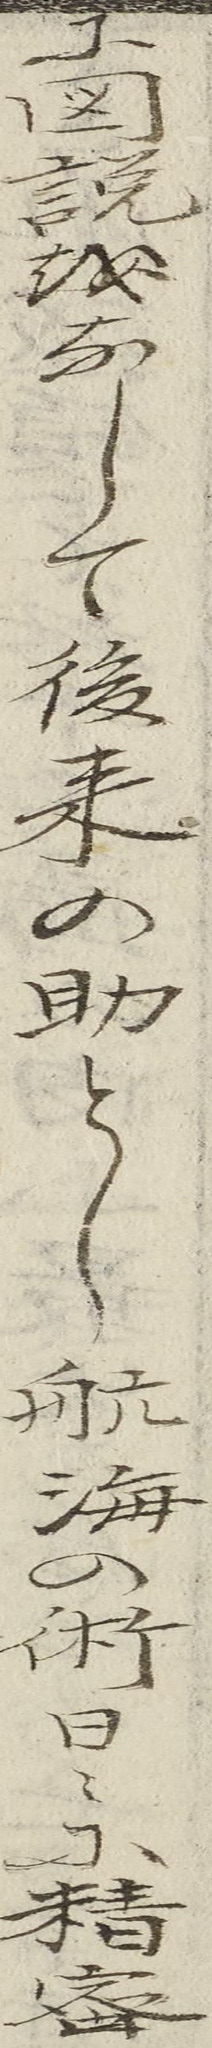に図説をなして後來の助とし航海の術日々に精密
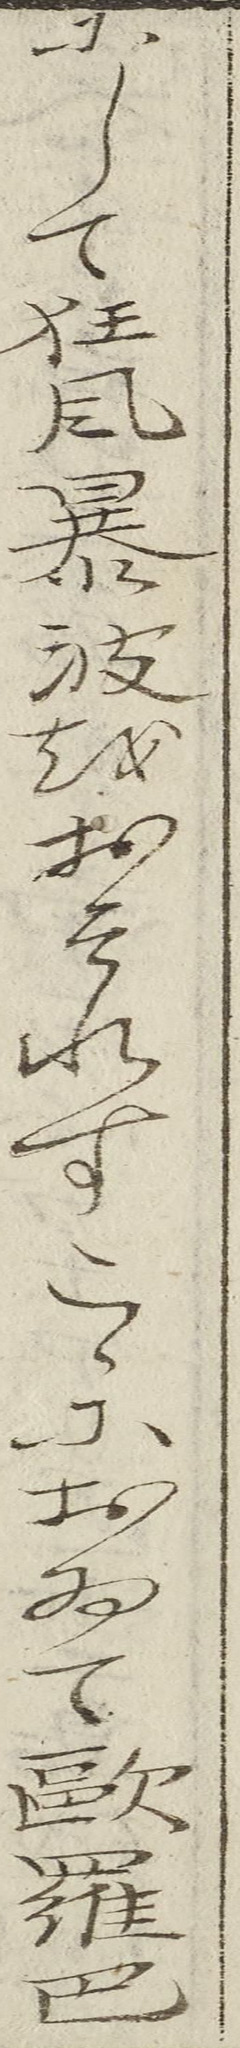にして狂風暴波をおそれすこゝにおゐて欧羅巴
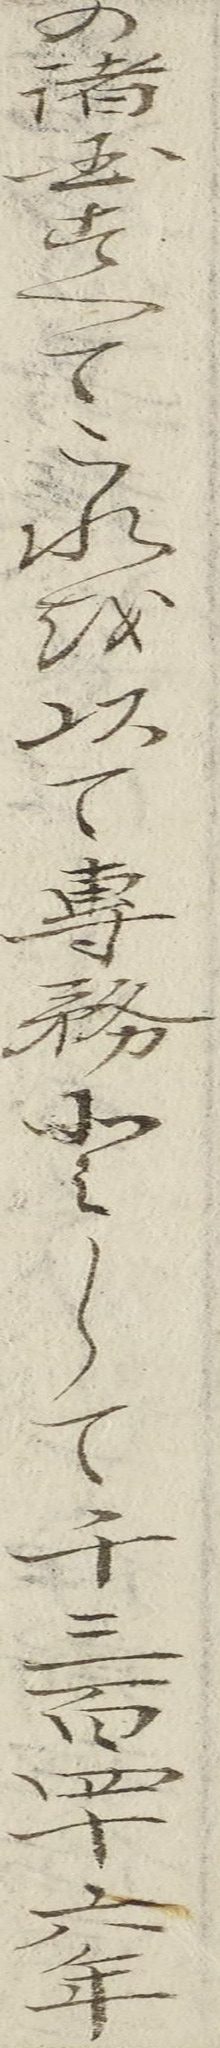の諸国すへてこれを以て専務にミして千三百四十六年
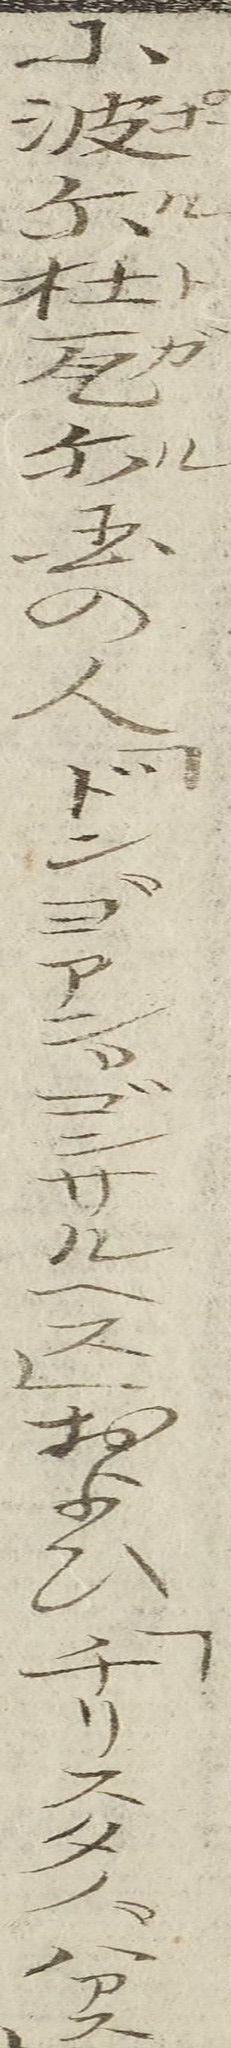に波尓杜瓦尓国の人「ドン。ヨアン。ゴンサルへス」およひ「チリスタノ。ハァス」
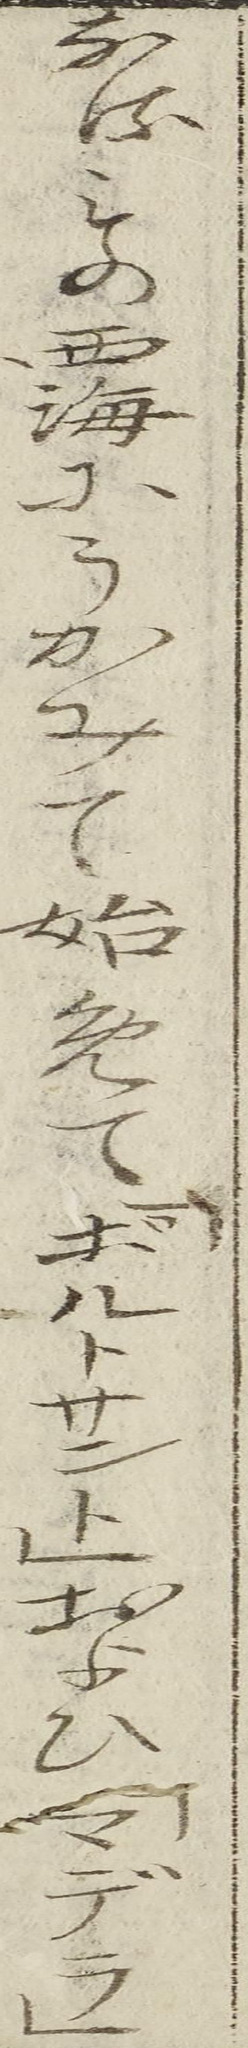るもの西海にうかみて始めて「ポルトサント」およひ「マデラ」

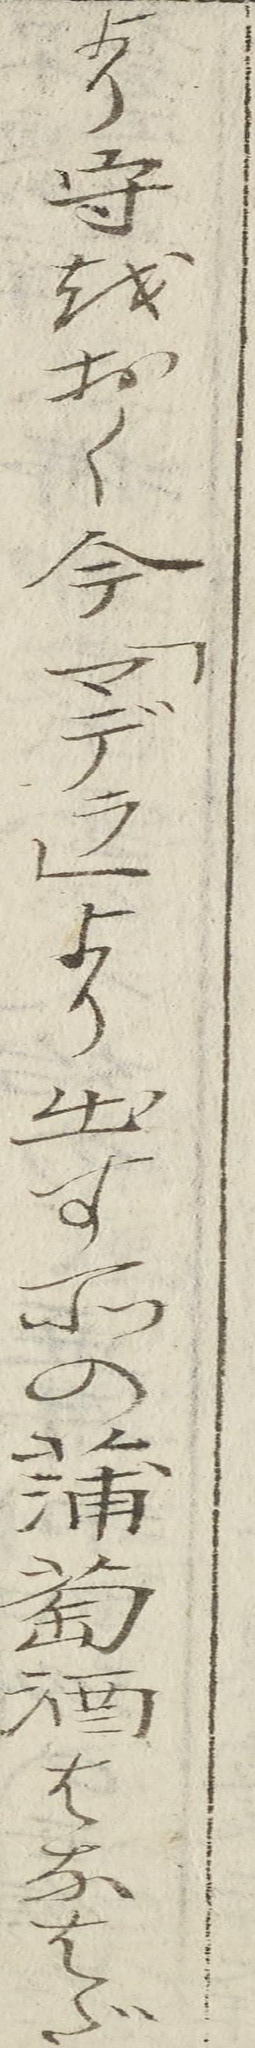より守をおく今「マデラ」より出す所の蒲萄酒はなはだ
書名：西洋雜記　乾
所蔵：東京大学地震研究所図書室 Earthquake Research Institute Library, The University of Tokyo, JAPAN
